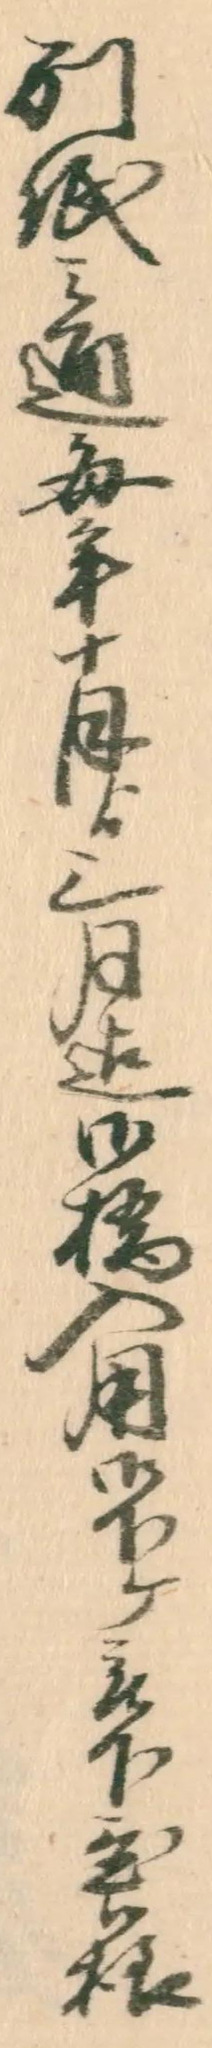別紙之通毎年十月ゟ三月迄御橋入用御下ケ被下置候様
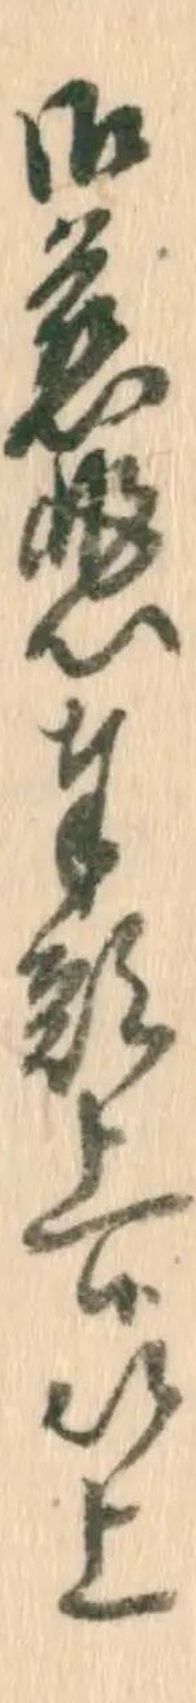御慈悲奉願上候以上
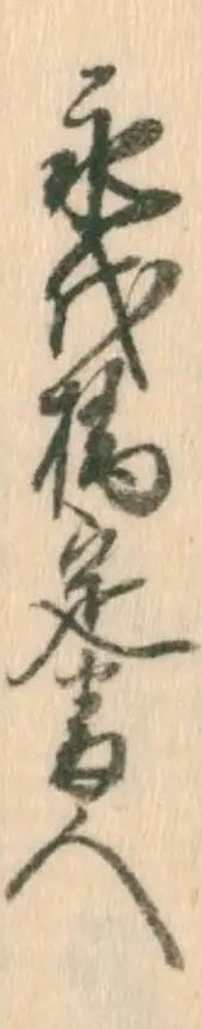永代橋定番人
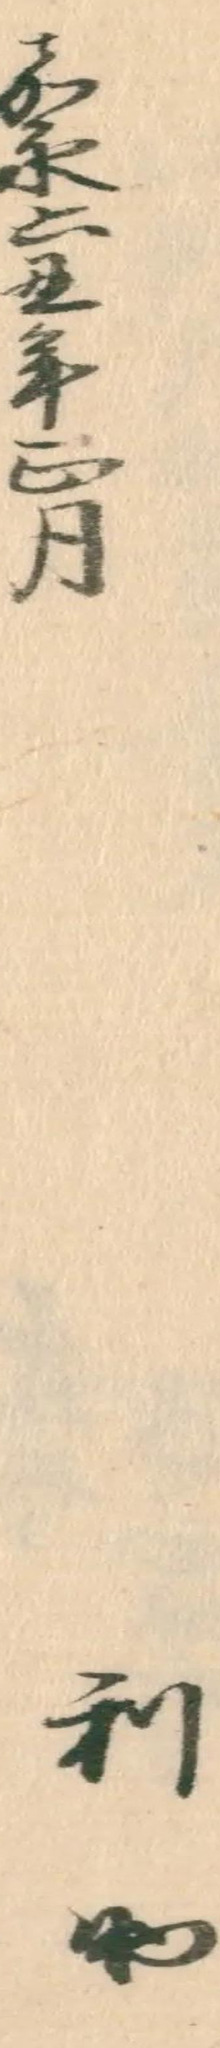嘉永六丑年正月利助
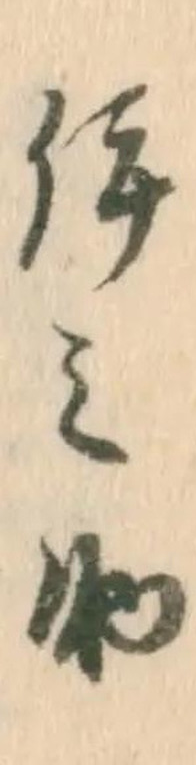伊之助
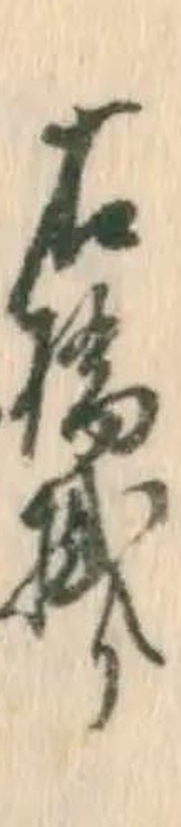右橋掛り
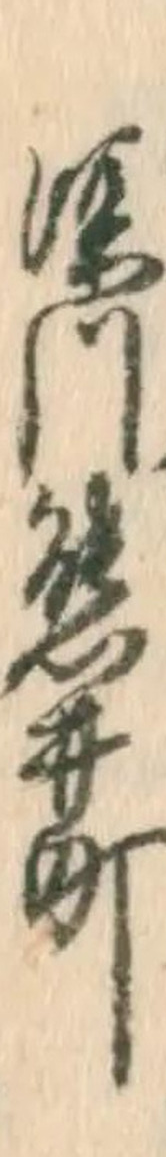深川熊井町
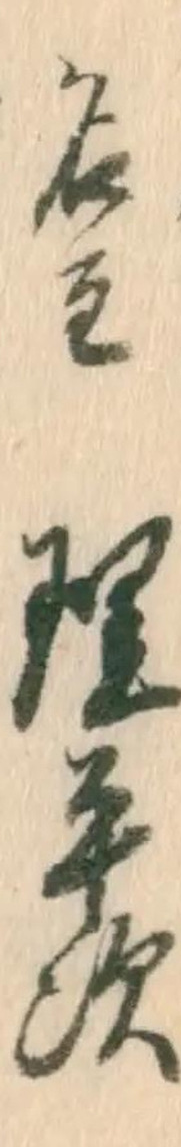名主理平次
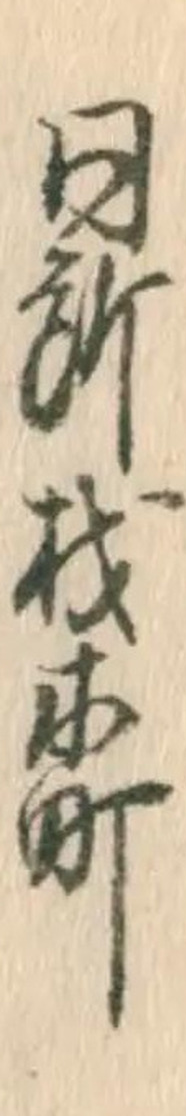同所材木町
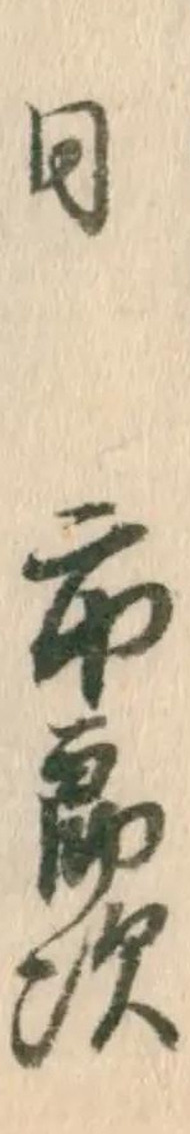同市郎次
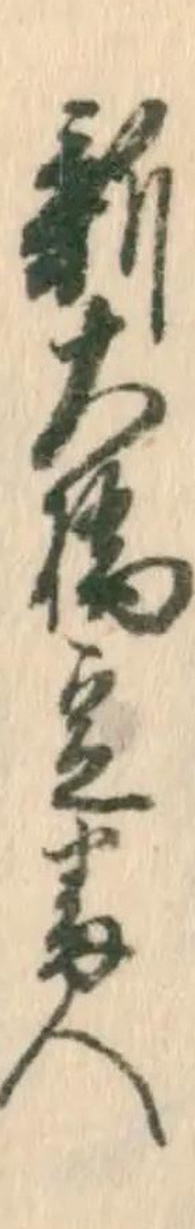新大橋定番人
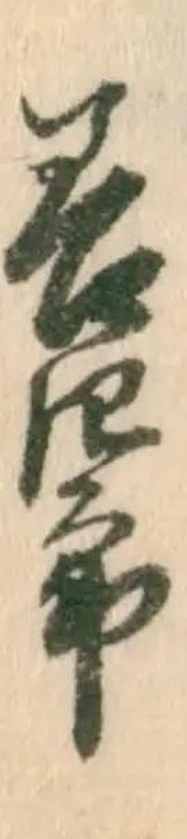善四郎

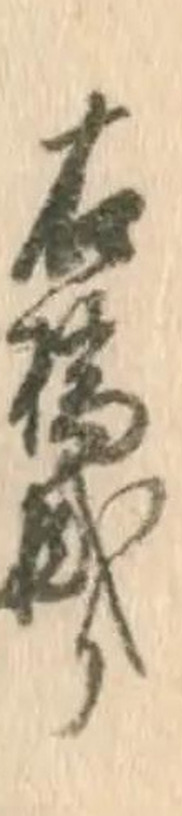右橋掛り
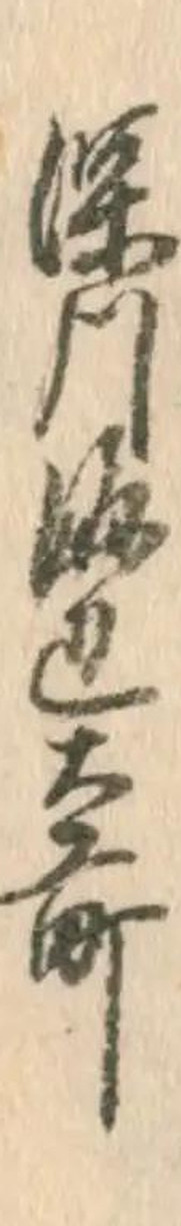深川海辺大工町
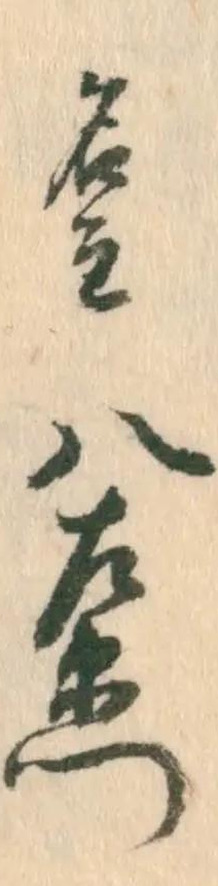名主八左衛門
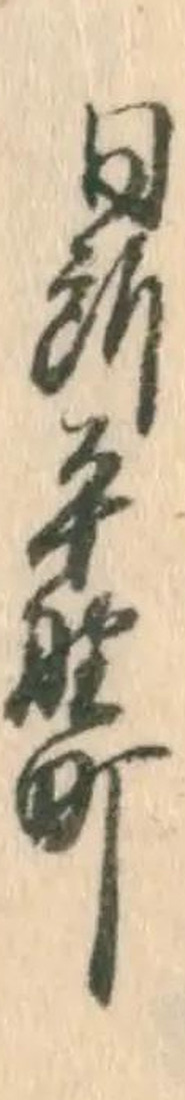同所平野町
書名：三橋 17巻. [7] 三橋小破御修復書留　但御奉行御掛リ替地震潰橋番屋　嘉永四亥年より安政二卯年迄　上
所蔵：国立国会図書館 National Diet Library, JAPAN
